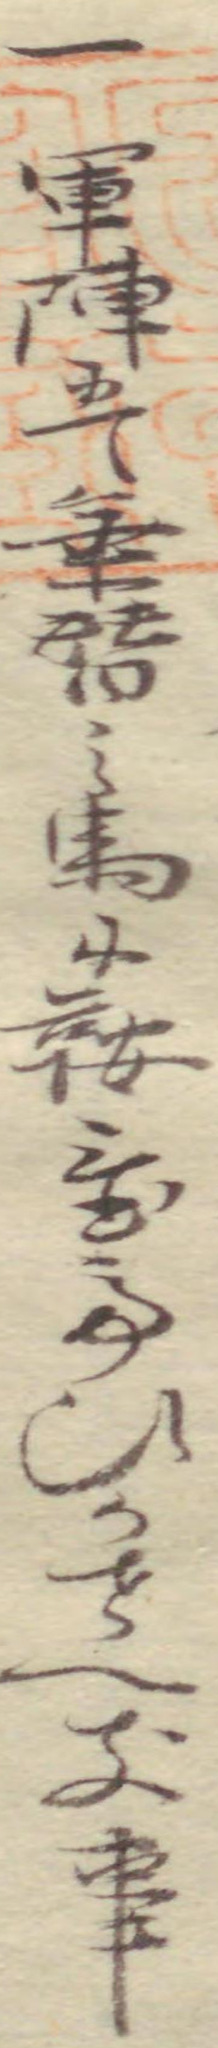一軍陣にて乗替之馬に鞍置てひかせへき事
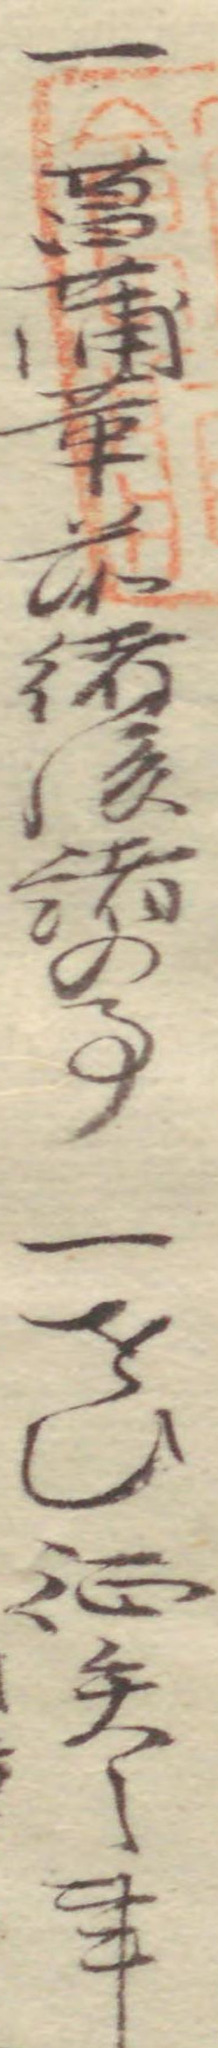一菖蒲革前緒後緒の事一をひ征矢之事
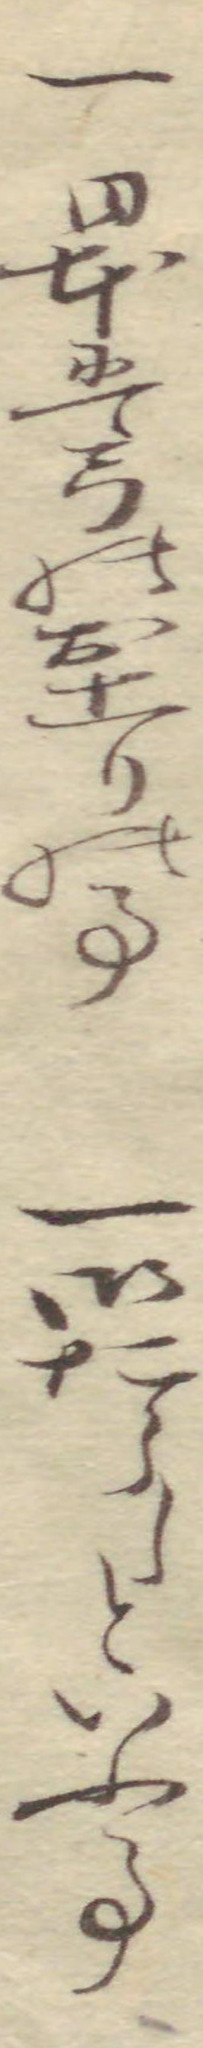一日本にて弓のおこりの事一御たらしといふ事
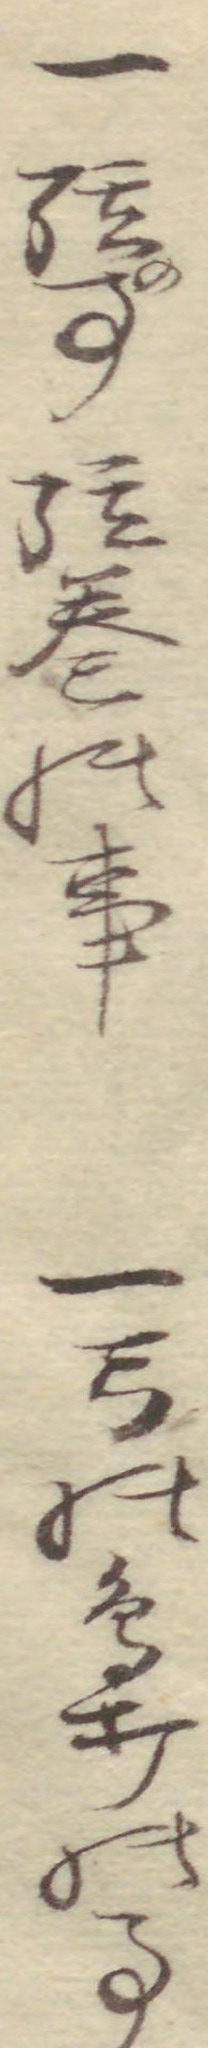一弦の事弦巻の事一弓の鳥打の事
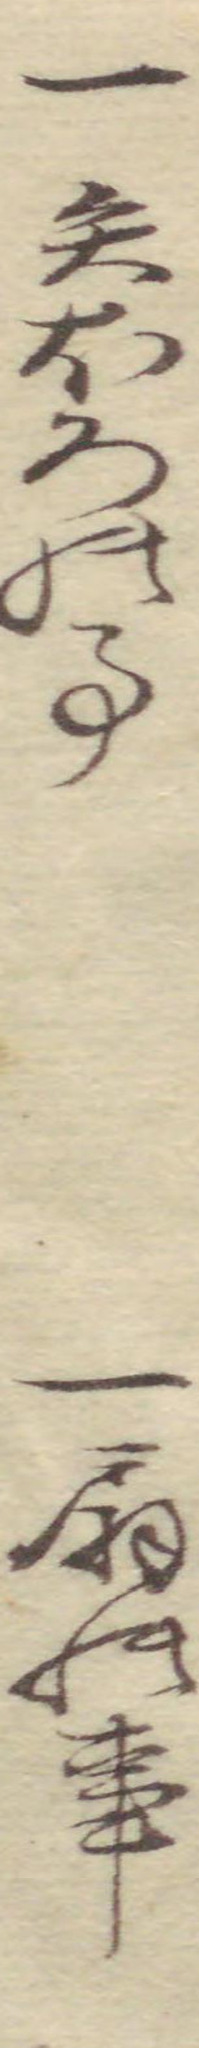一矢ほろの事一扇の事

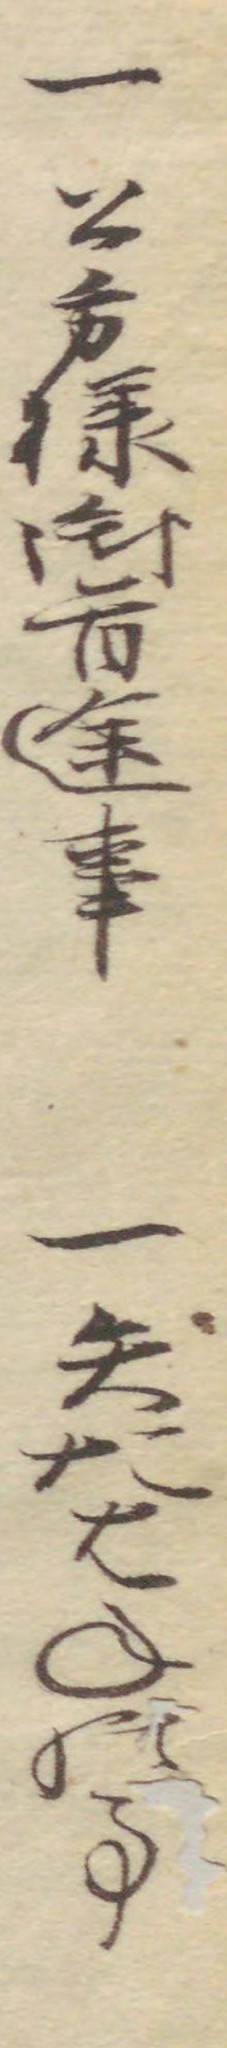一公方様御首途事一矢たはねの事
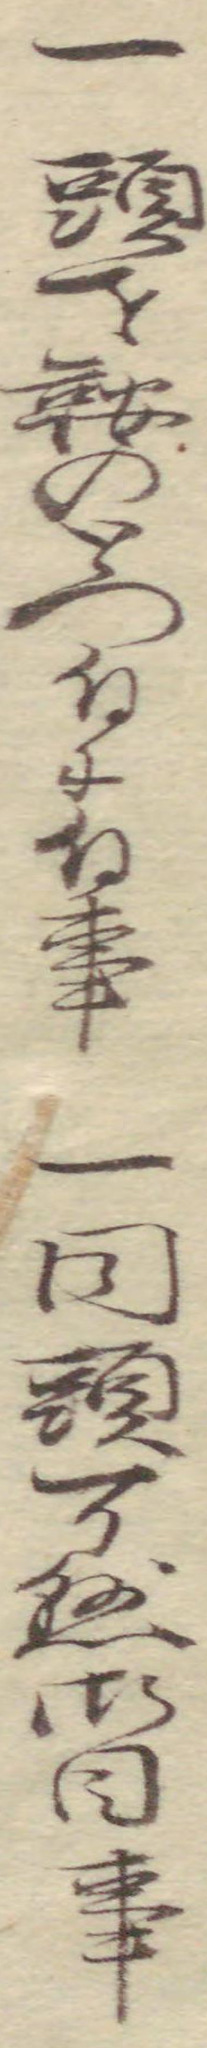一頭を鞍のとつ付に付事一同頭可懸御目事
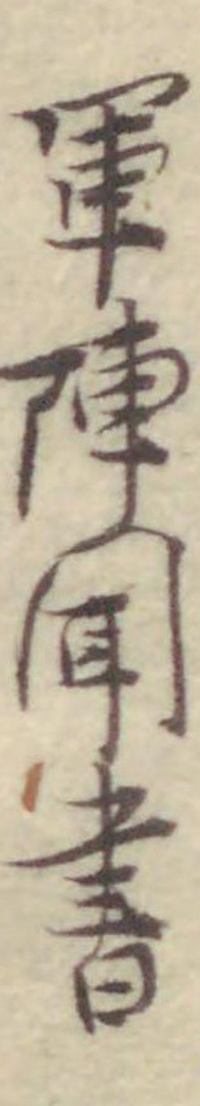軍陣聞書
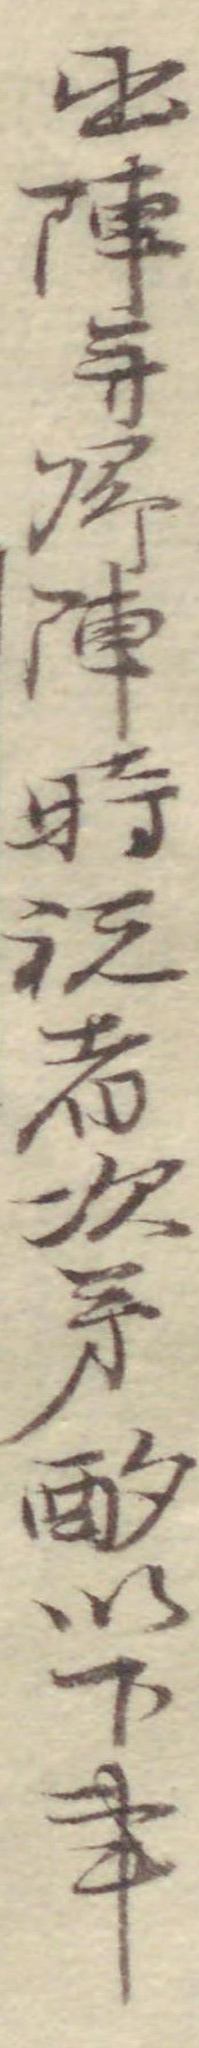出陣幷帰陣時祝者次第酌以下事
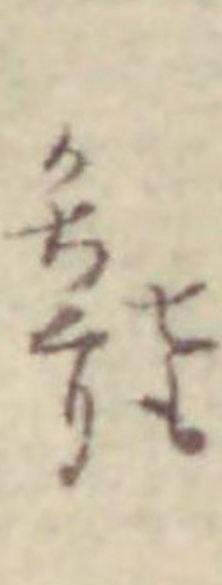かちくり
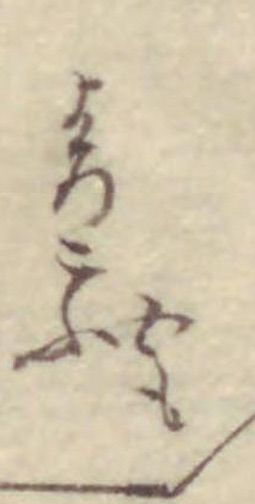よろこふ
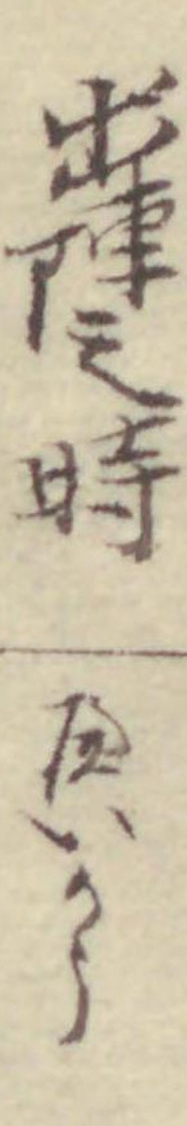出陣之時へいかう三
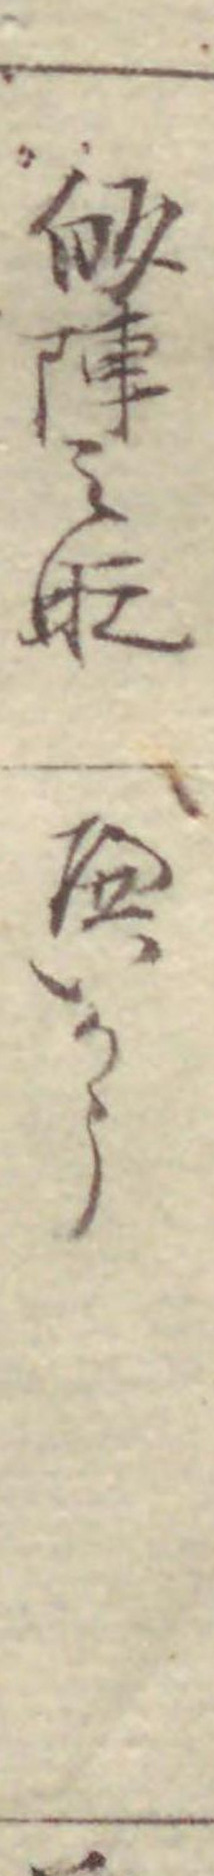帰陣之時へいかう前
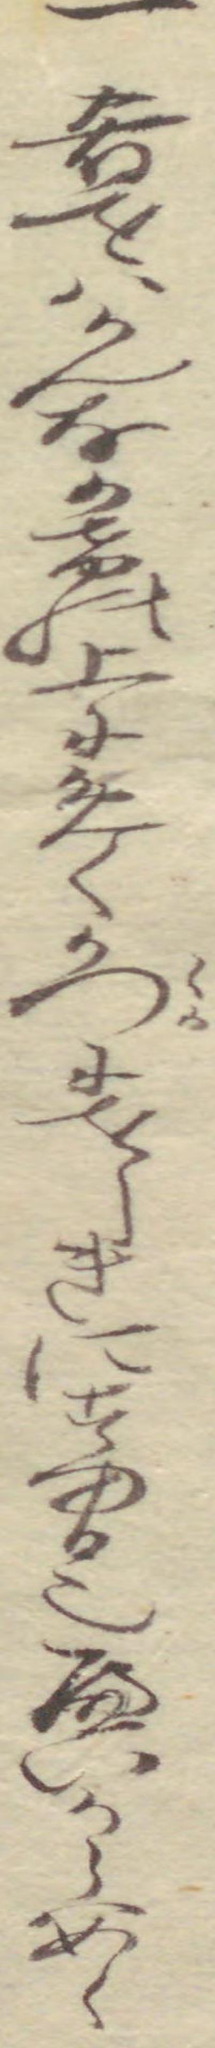一肴をハかんなかけの上にめゝかつにおしきにすゆる也へいかうハめゝ
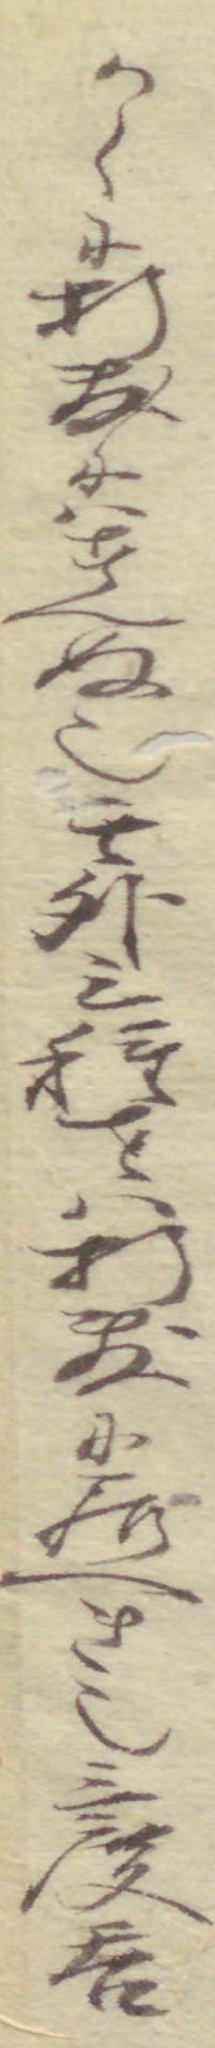かくに折敷にハはすへぬ也其外三種をハ折敷に居へき也三度呑
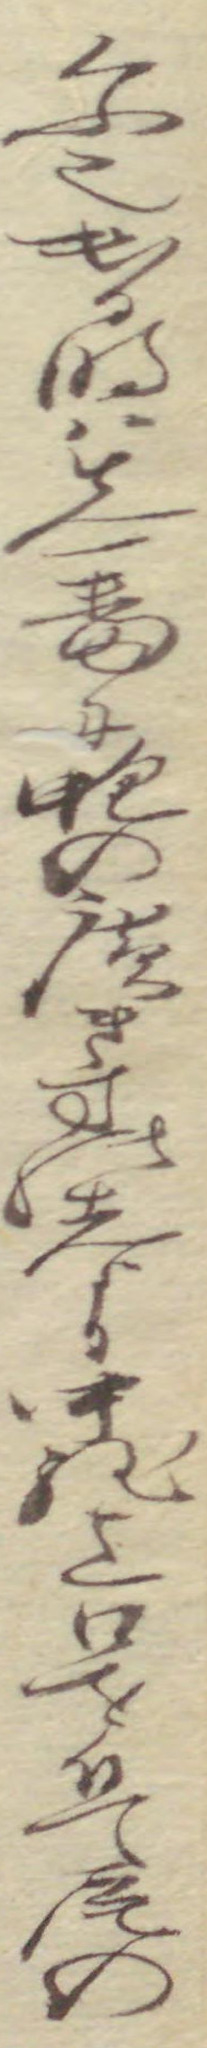くふ也出る時ハ先一番に蚫の広き方の先より中程迄口を付て尾の
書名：鶯宿雑記. 巻199-200
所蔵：国立国会図書館 National Diet Library, JAPAN
